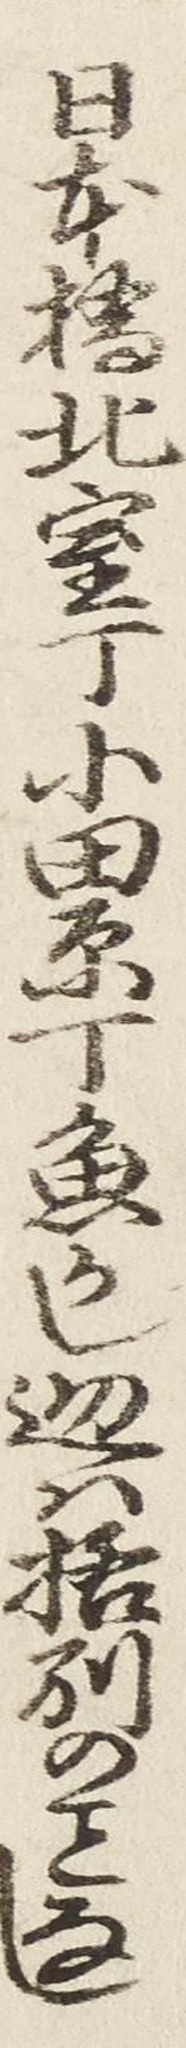日本橋北室丁小田原丁魚かし辺は格別のことなし
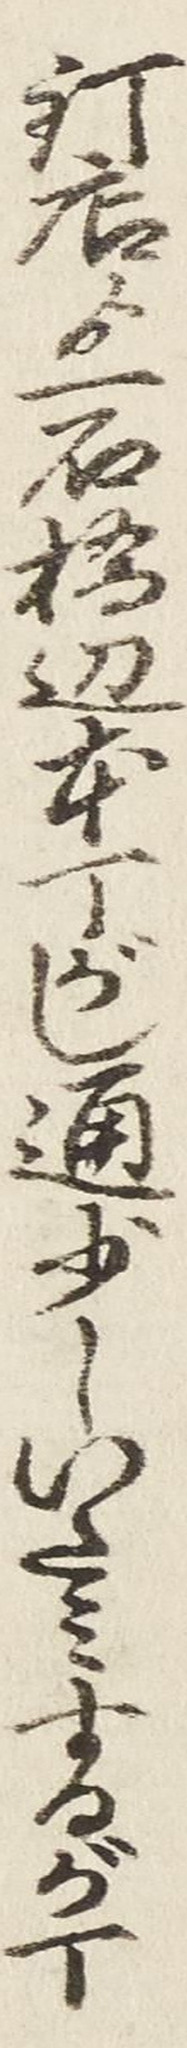釘店ゟ一石橋辺本丁がし通少しいたみするが丁
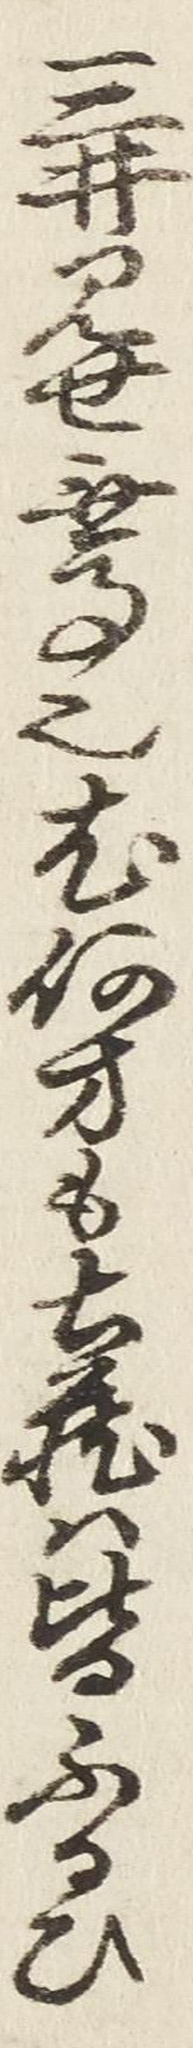三井見せ無事也尤何方も土蔵は皆ふるひ
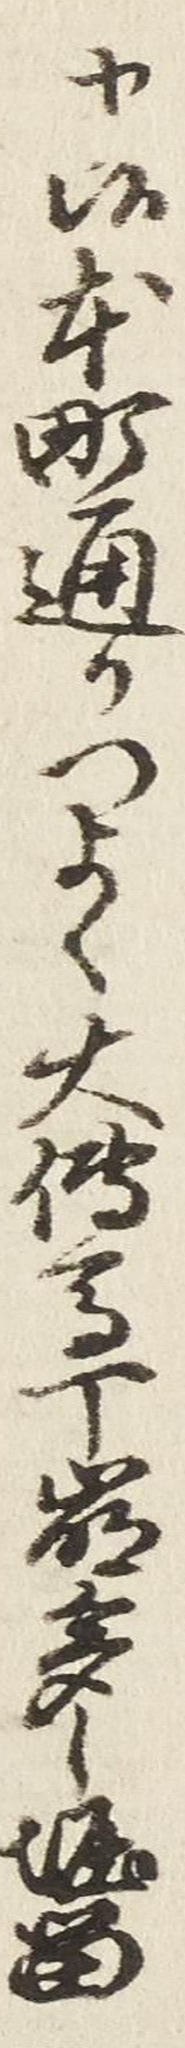申候本町通りつよう大伝馬丁崩多し堀留
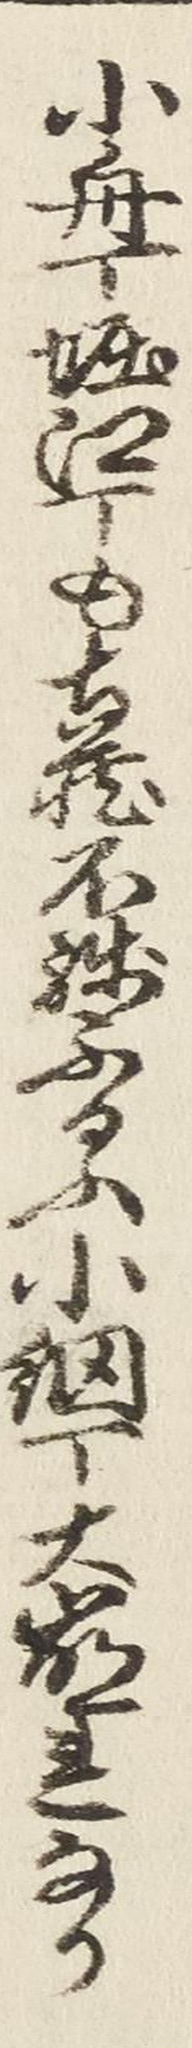小舟丁堀江丁も土蔵不残ふるふ小網丁大崩れなり
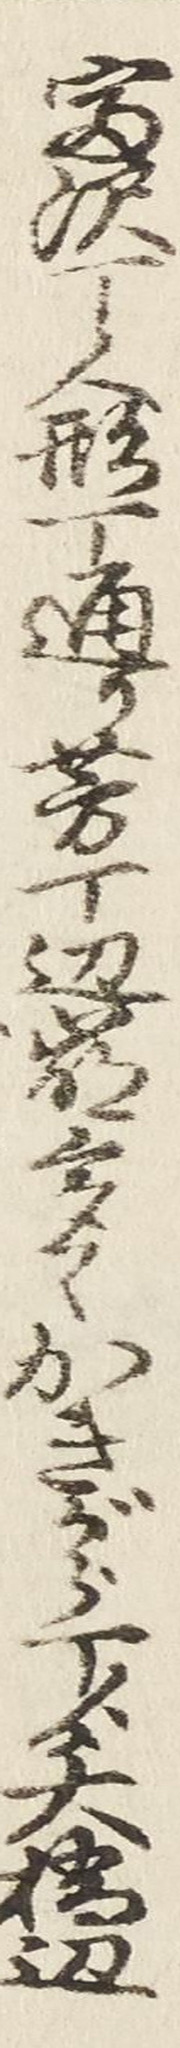富沢丁人形丁通り芳丁辺崩多くかきがら丁ゟ大橋辺
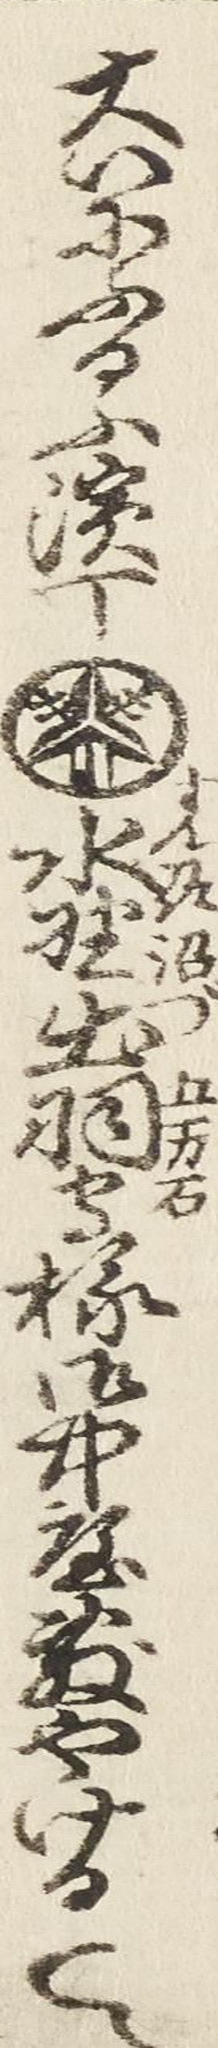大いにふるふ浜丁水野出羽守様御中屋敷やける
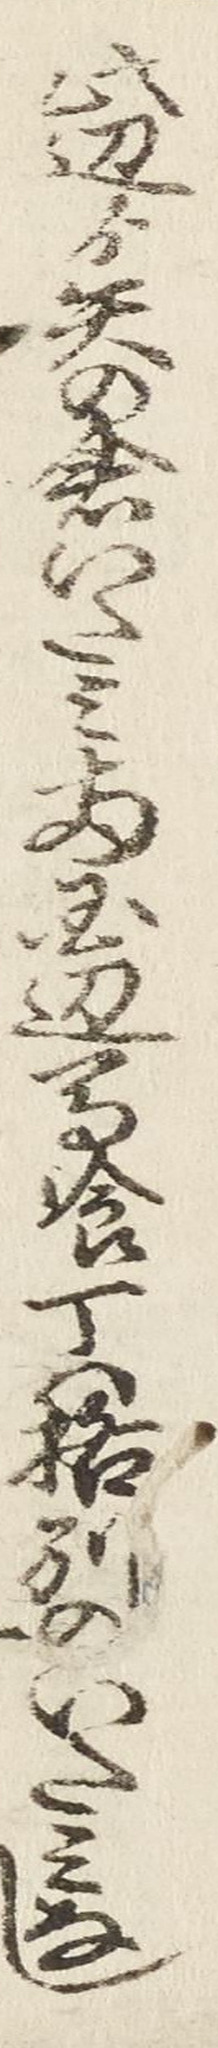此辺ゟ矢の倉いたみ両国辺馬喰丁は格別のいたみなし
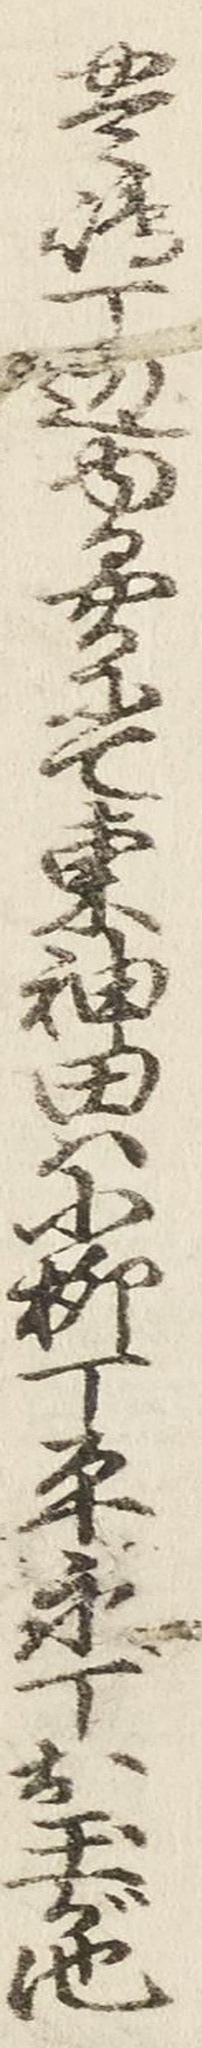豊嶋丁辺ゆるやかにて東神田は小柳丁平永丁お玉が池
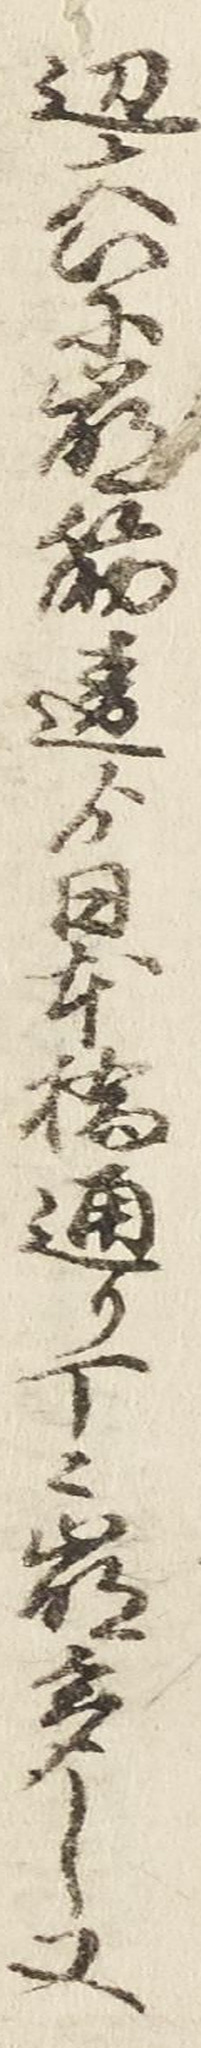辺大いに崩筋違ゟ日本橋通り丁々崩多し又
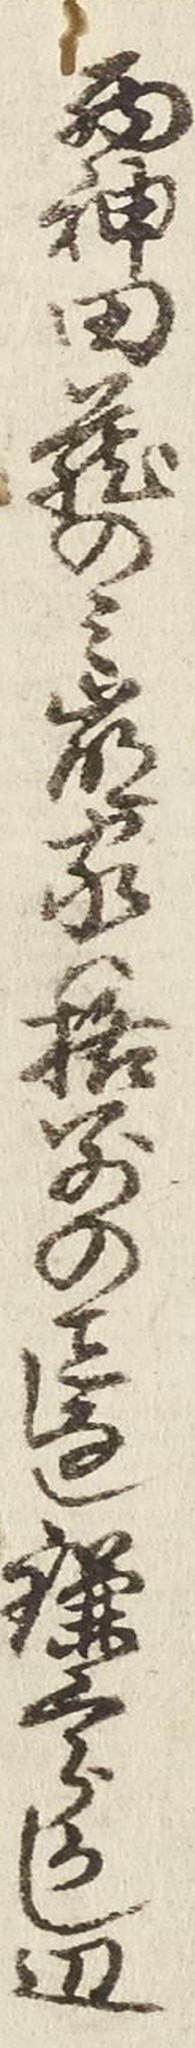西神田蔵のみ崩家は格別のことなし鎌くらかし辺
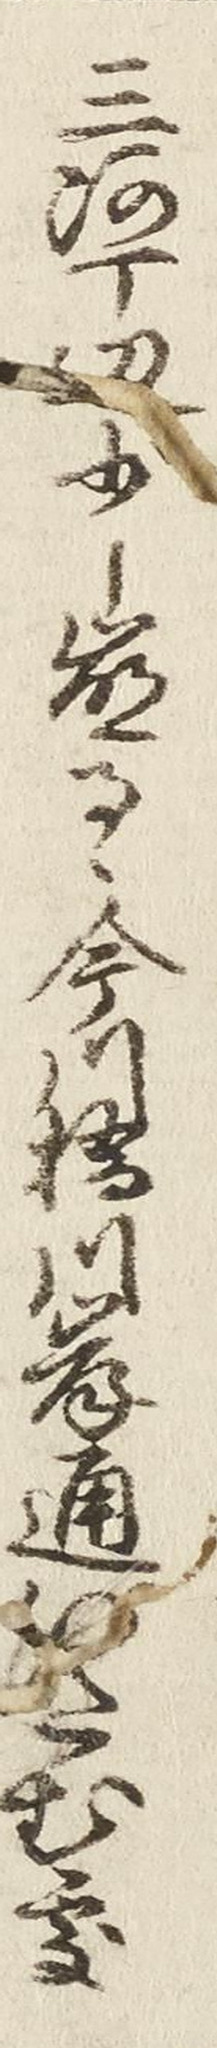三河丁辺少し崩るゝ今川橋川岸通いたむ処
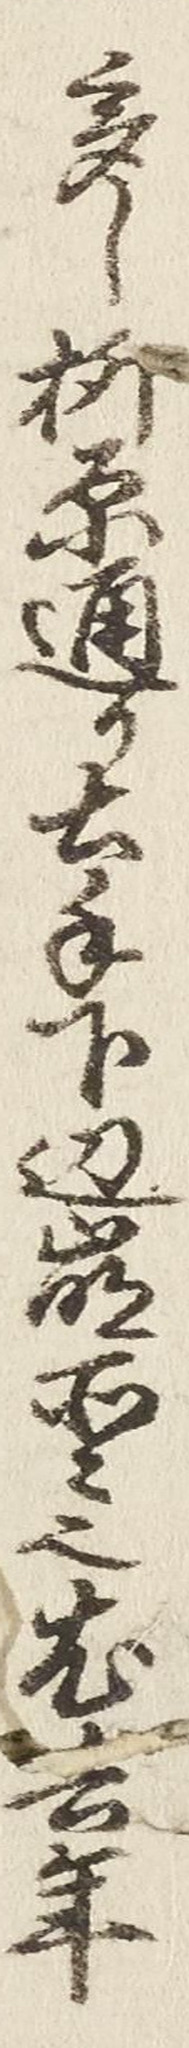多し柳原通り土手下辺崩所々也尤去年
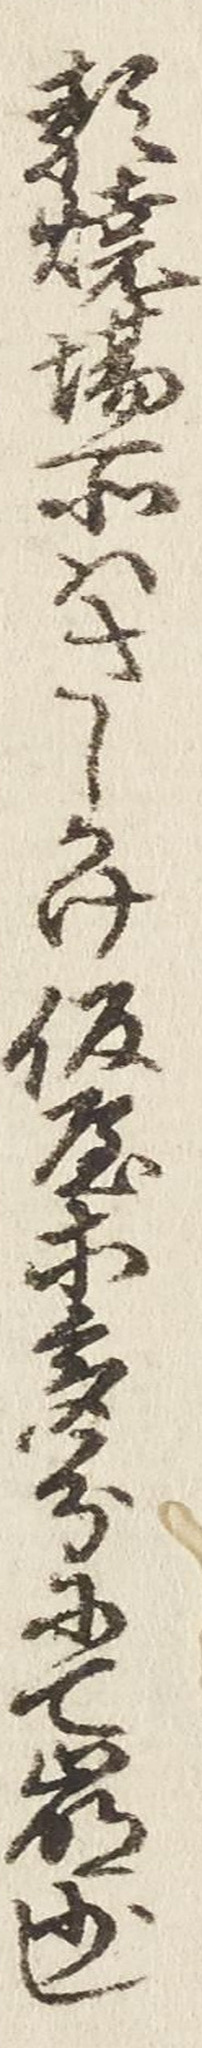類焼場所はさしかけ仮屋等多分にて崩少し
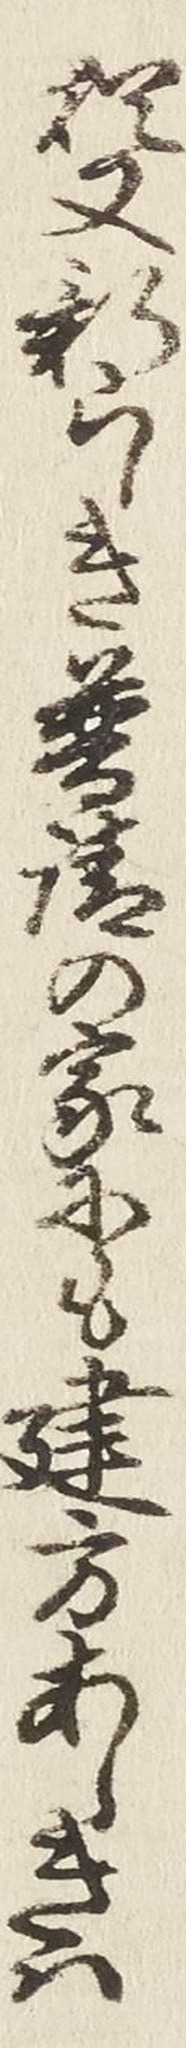猶又新らしき普請の家にも建方あしきは
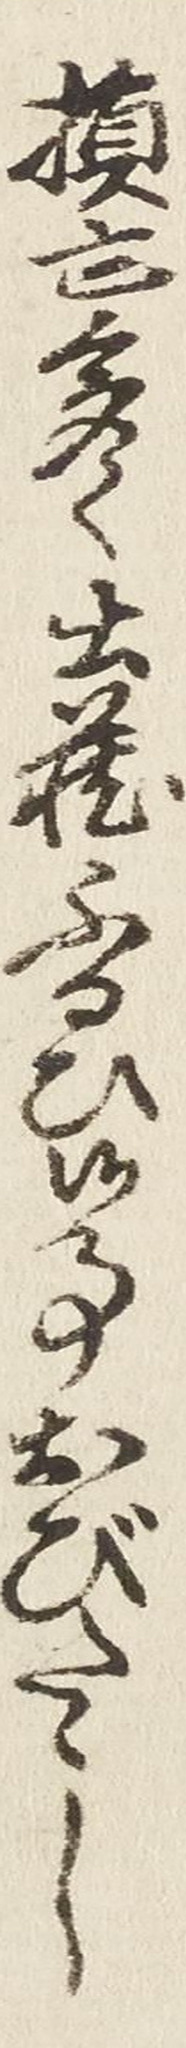損亡多く土蔵ふるひ候事おびたゝし
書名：江戸みやげ
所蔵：東京大学地震研究所図書室 Earthquake Research Institute Library, The University of Tokyo, JAPAN
